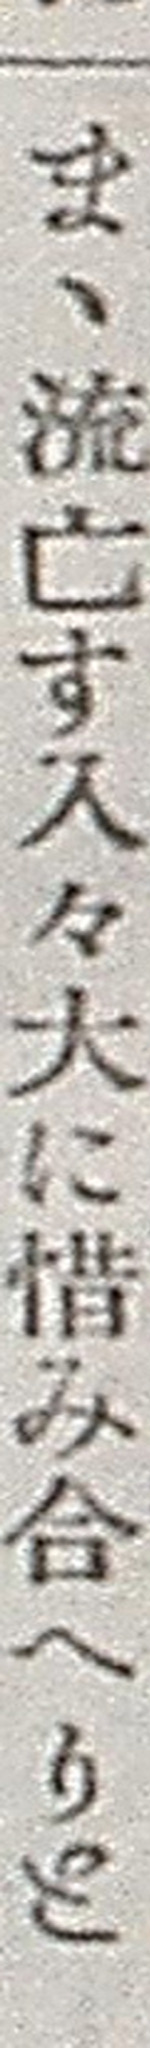まゝ流亡す人々大に惜み合へりと
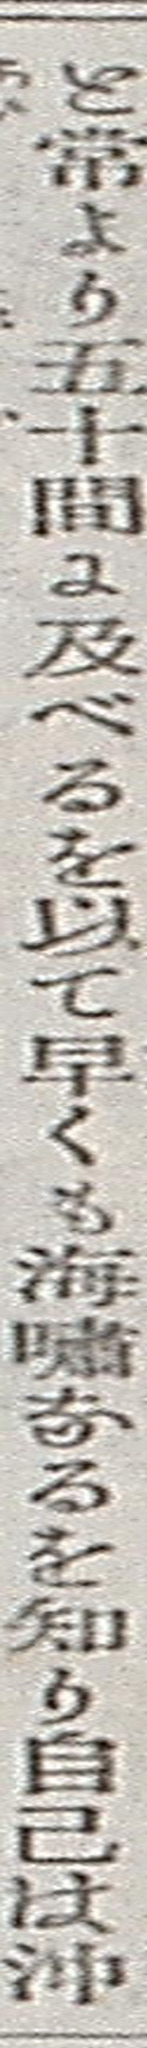と常より五十間に及べるを以て早くも海嘯なるを知り自己は沖
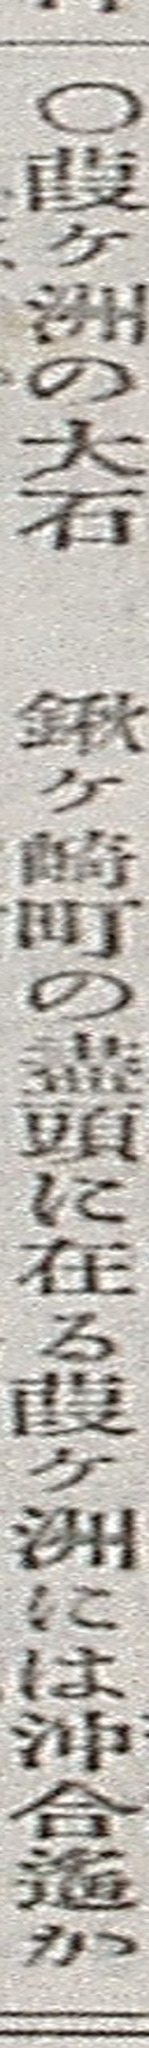○葭ヶ洲の大石鍬ヶ崎の尽頭に在る葭ヶ洲には沖合遙か
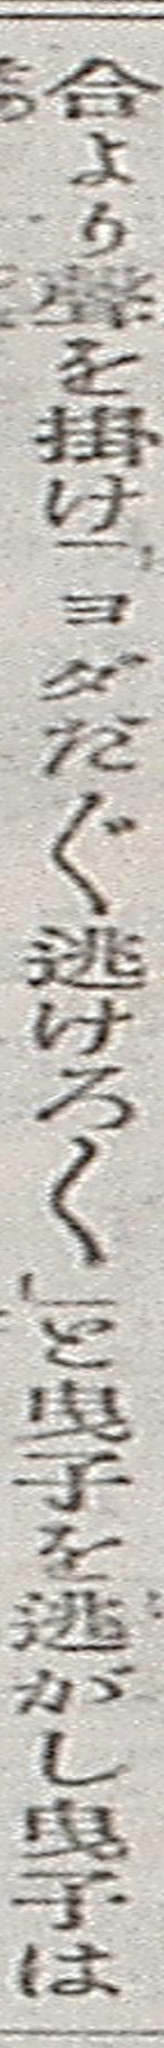合より声を掛け「ヨダだ〴〵逃げろ〳〵」と曳子を逃がし曳子は
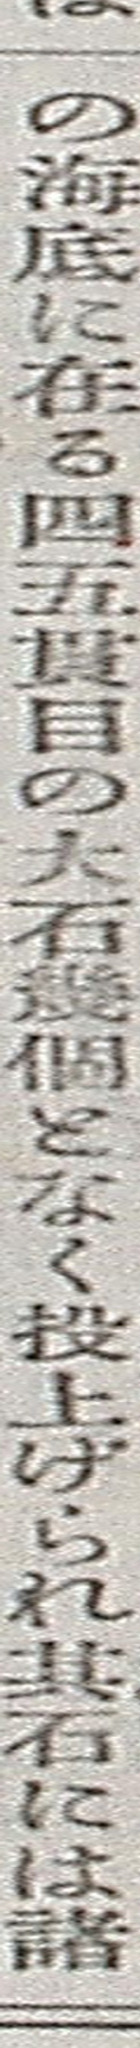の海底に在る四五貫目の大石幾個となく投上げられ其石には諸
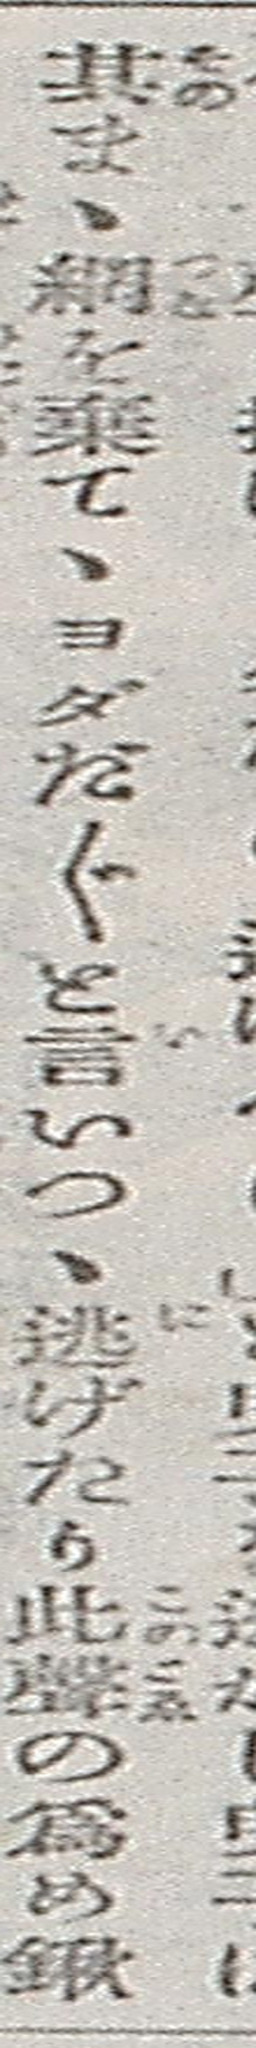其まゝ綱を棄てゝヨダだ〴〵と言いつゝ逃げたり此声の為め鍬
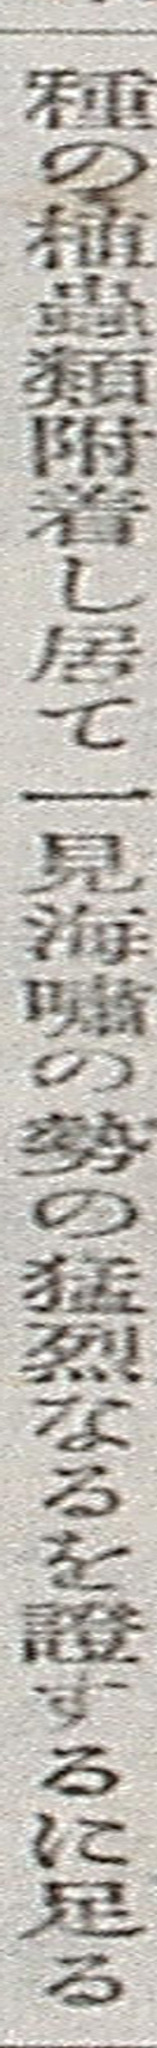種の植蟲類付着し居て一見海嘯の勢の猛烈なるを証するに足る
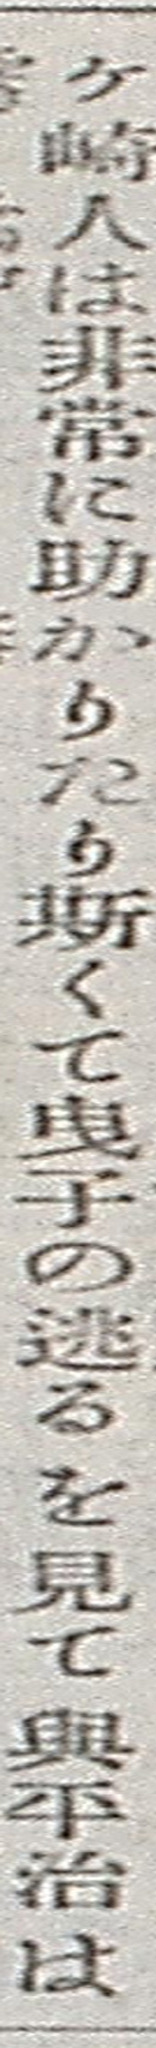ヶ崎人は非常に助かりたり斯くて曳子の逃るを見て與平治は
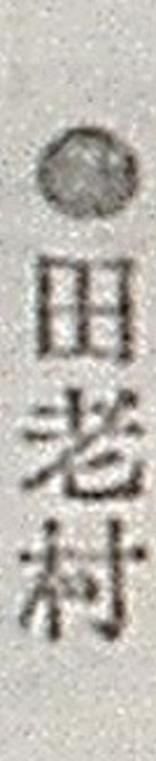●田老村
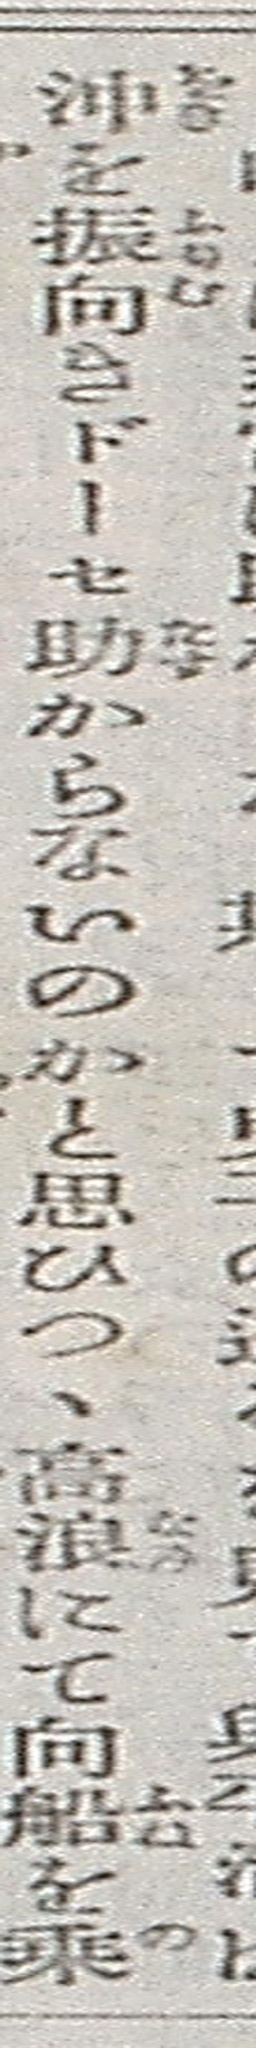沖を振向きドーセ助からないのかと思ひつゝ高浪にて向船を乗
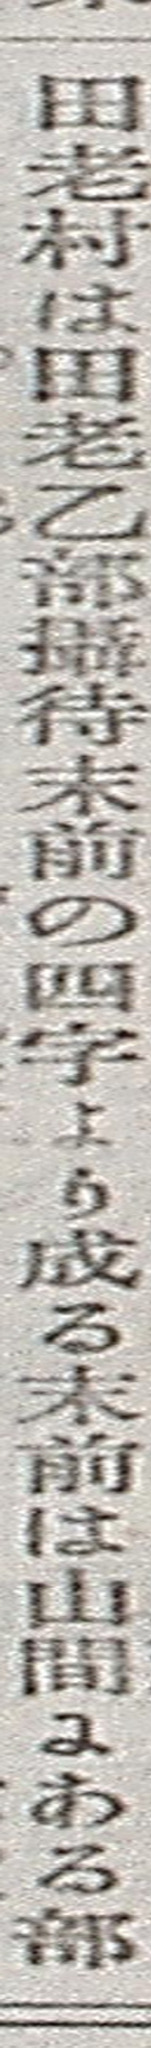田老村は田老乙部摂待末前の四字より成る末前は山間にある部
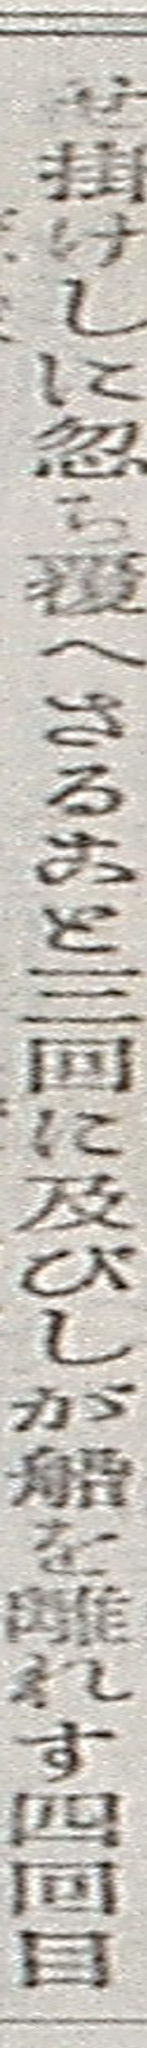せ掛けしに忽ち覆へさること三回に及びしが船を離れす四回目
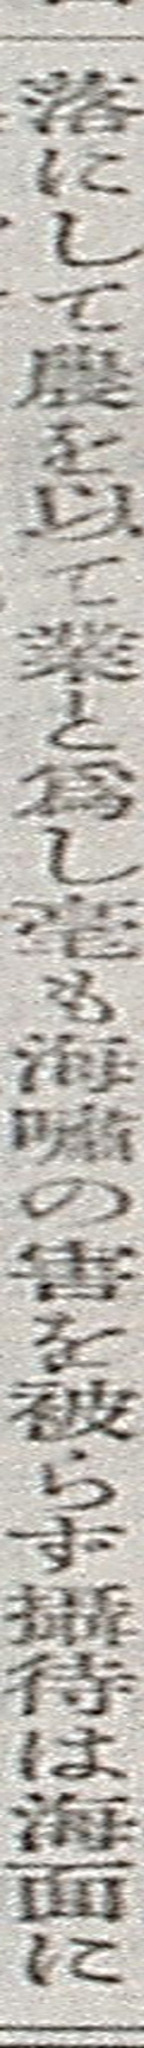落にして農を以て業と為し毫も海嘯の害を被らず摂待は海面に
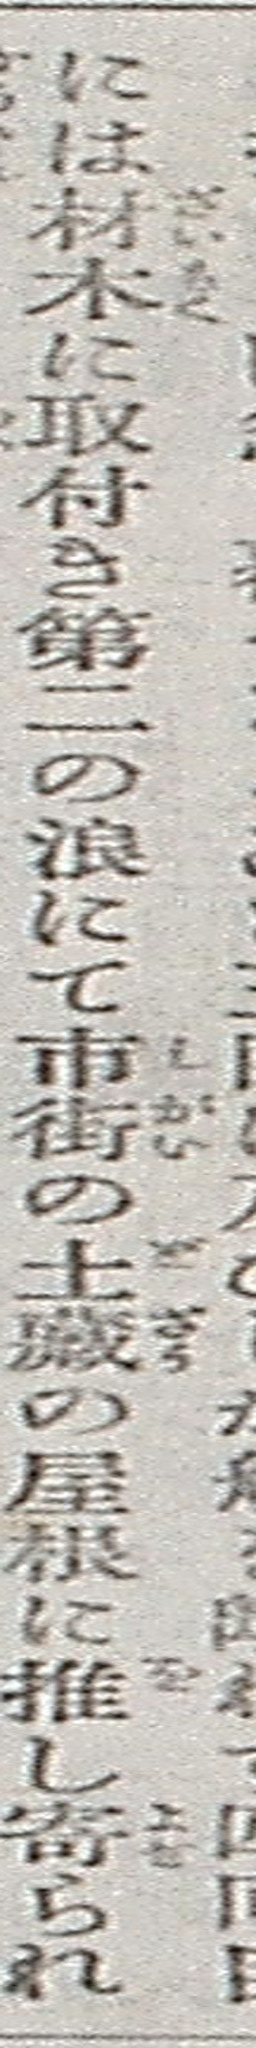には材木に取付き第二の浪にて市街の土蔵の屋根に推し寄られ
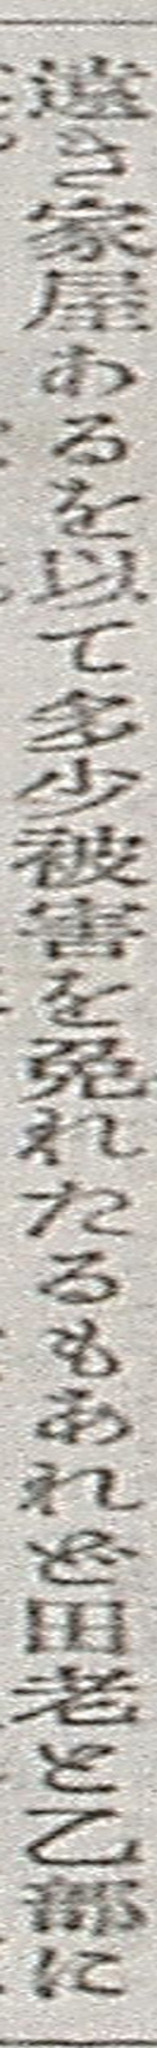遠き家屋あるを以て多少被害を免れたるもあれど田老と乙部に
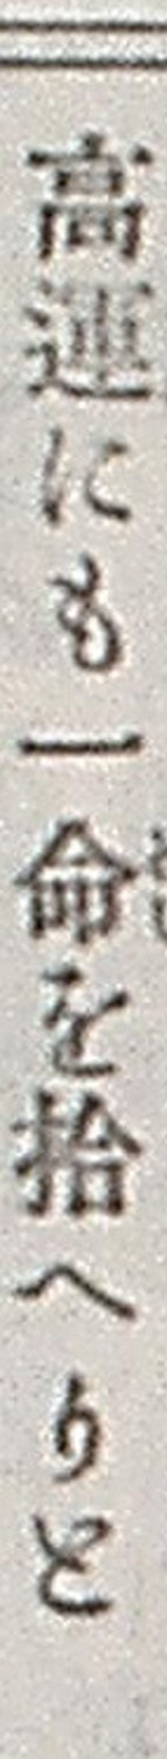髙運にも一命を拾へりと
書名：風俗畫報臨時増刊第百二十號　大海嘯被害録（下）
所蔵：東京大学地震研究所図書室 Earthquake Research Institute Library, The University of Tokyo, JAPAN
